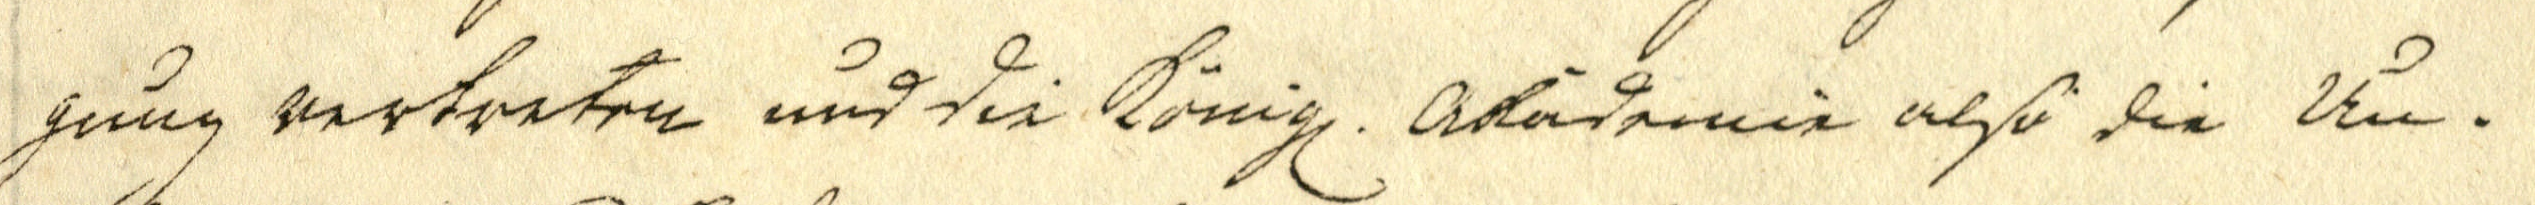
gung vertreten und die Königl. Akademie also die Un¬
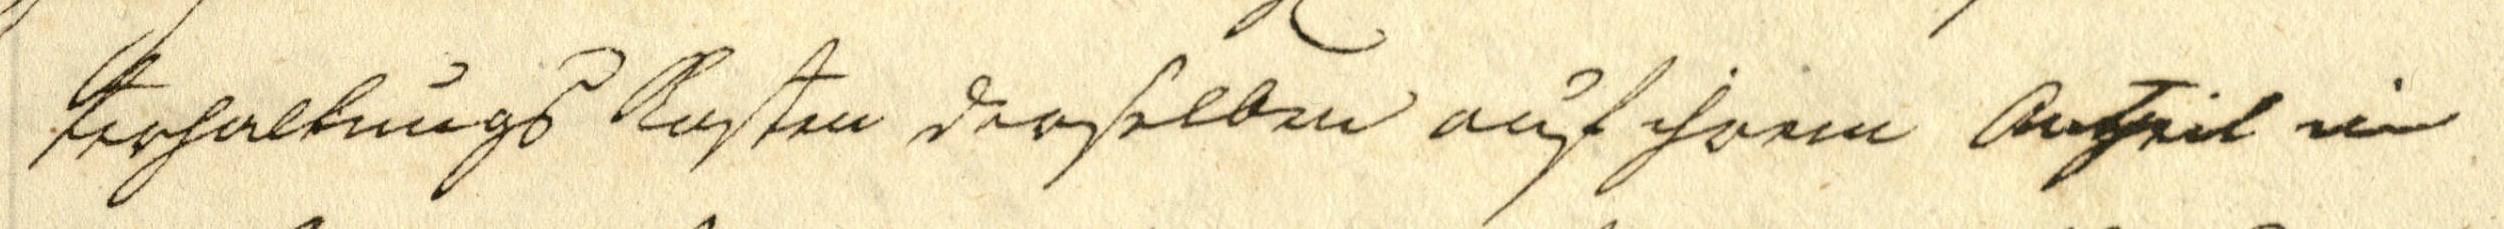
terhaltungs Kosten derselben auf ihrem Antheil in
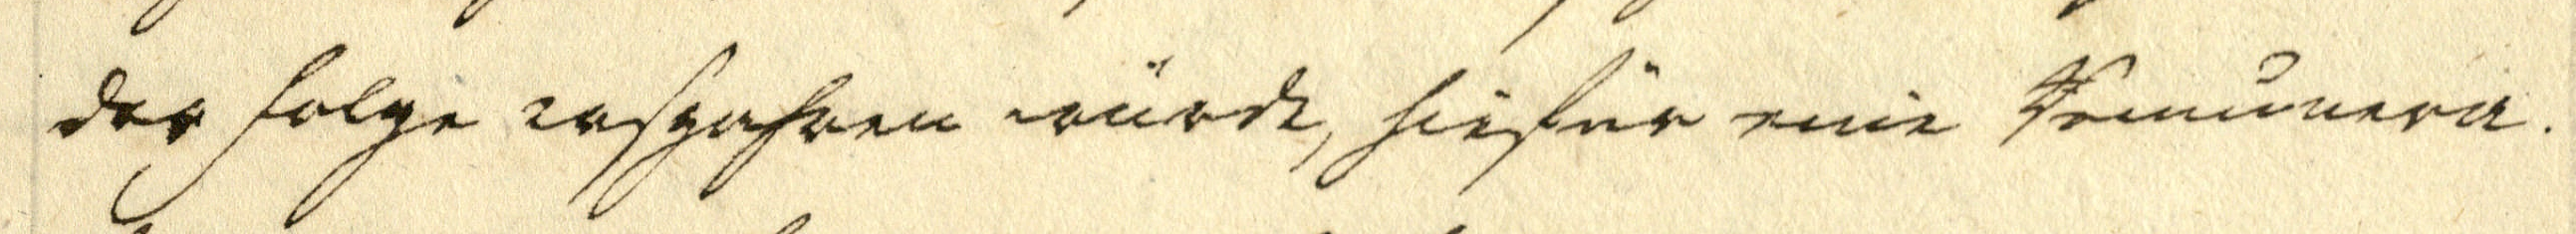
der Folge erspahren würde, hiefür eine Remunera¬
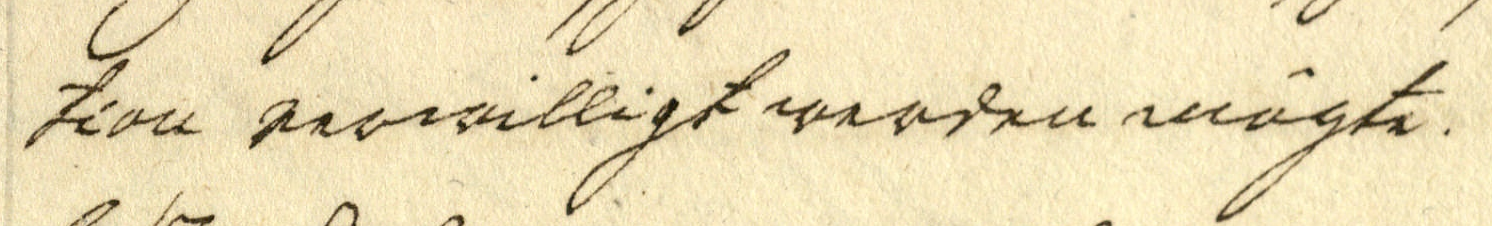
tion verwilligt werden mögte.
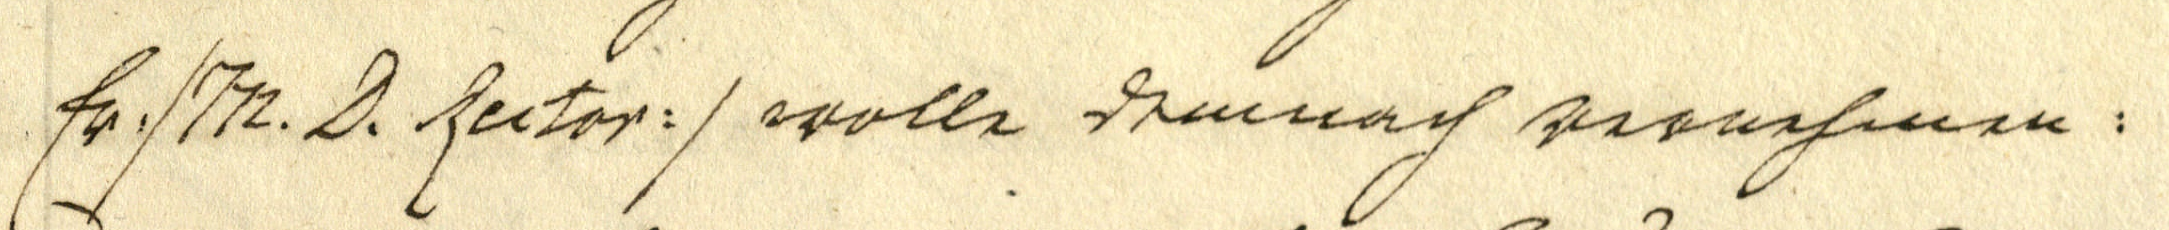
Er / M. D. Rector / wolle demnach vernehmen:
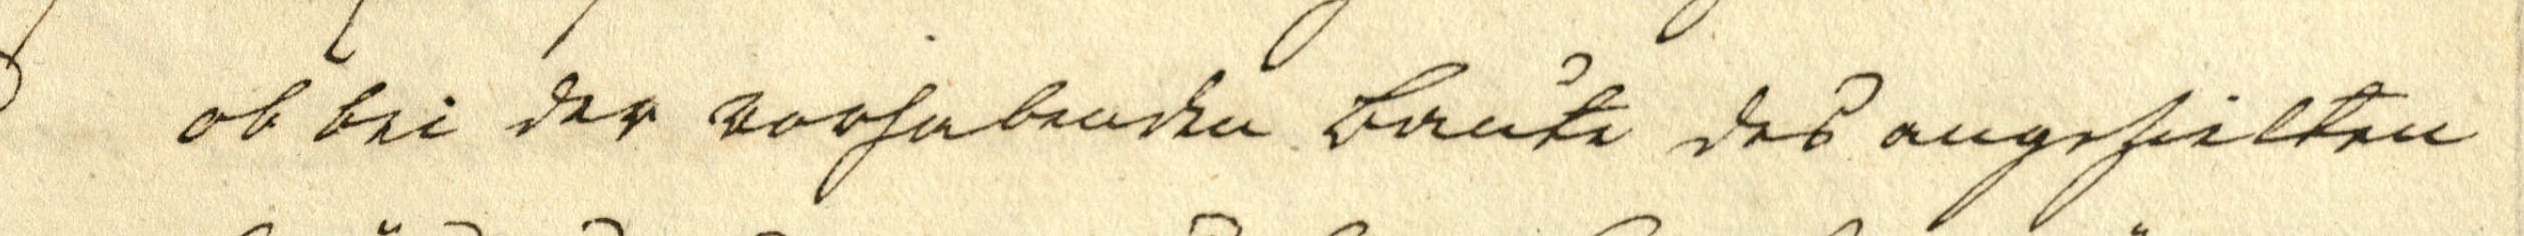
ob bei der vorhabenden Baute des angezielten
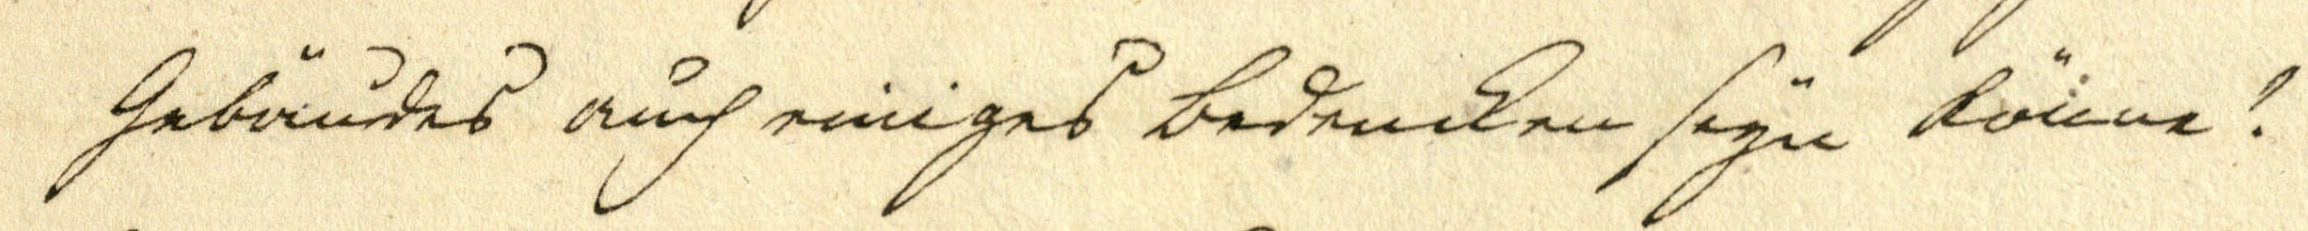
Gebäudes auch einiges Bedencken seÿn könne?
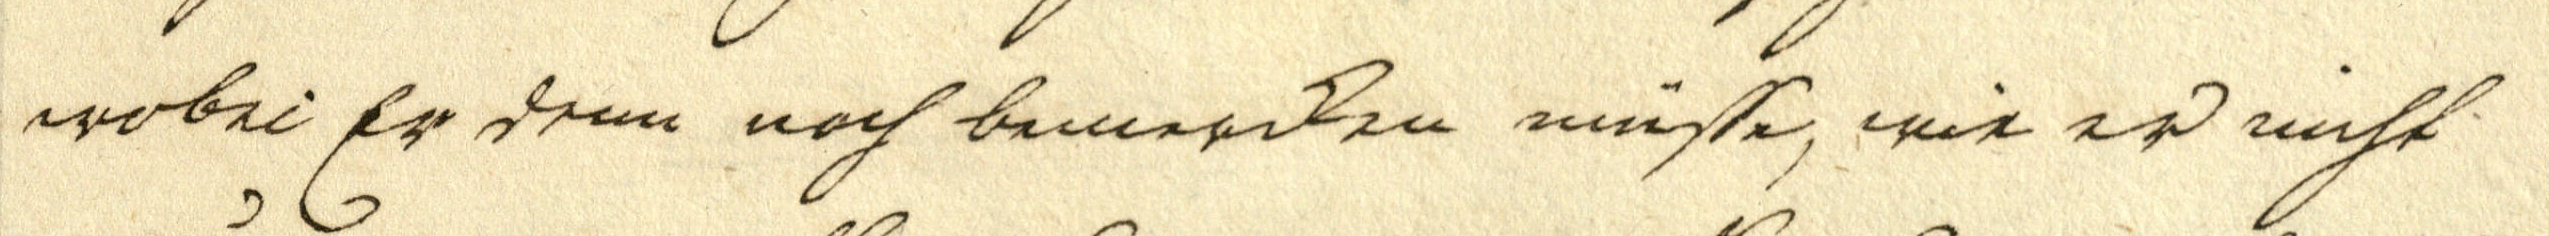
wobei Er denn noch bemercken müsse, wie er nicht
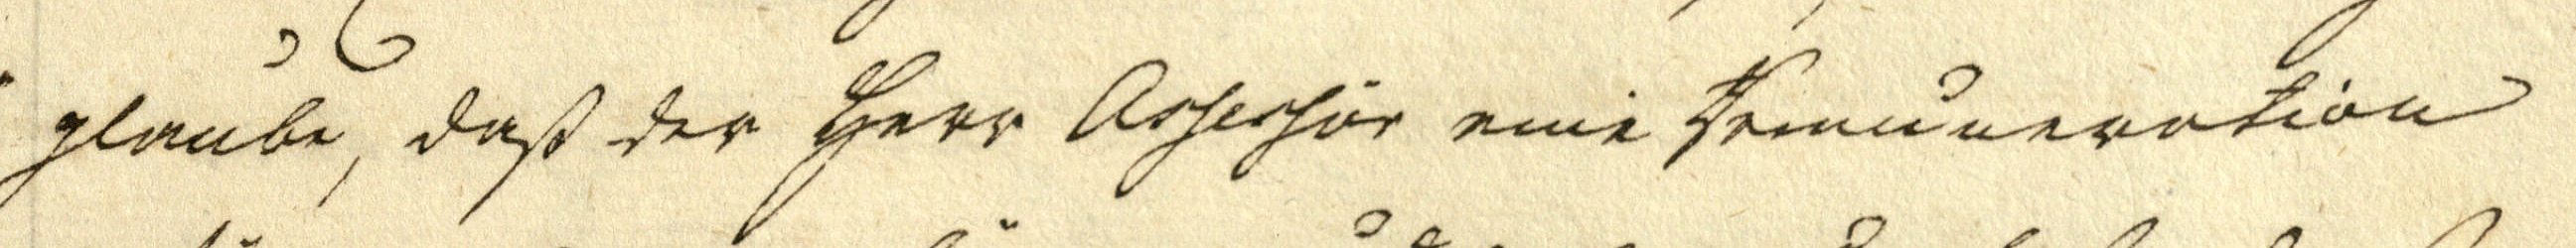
glaube, daß der Herr Assessor eine Remuneration
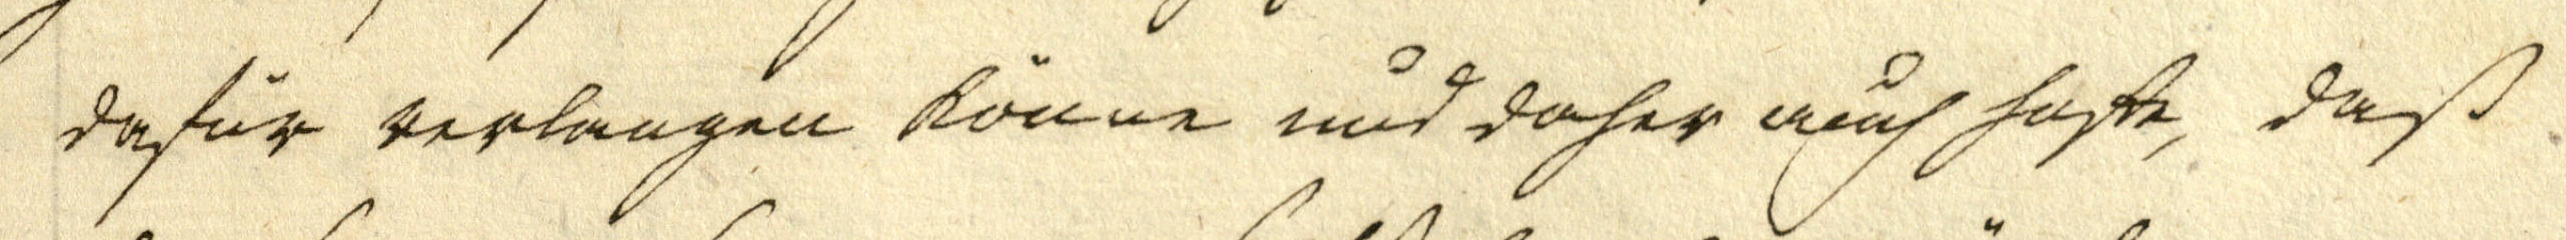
dafür verlangen könne, und daher auch hoffe, daß
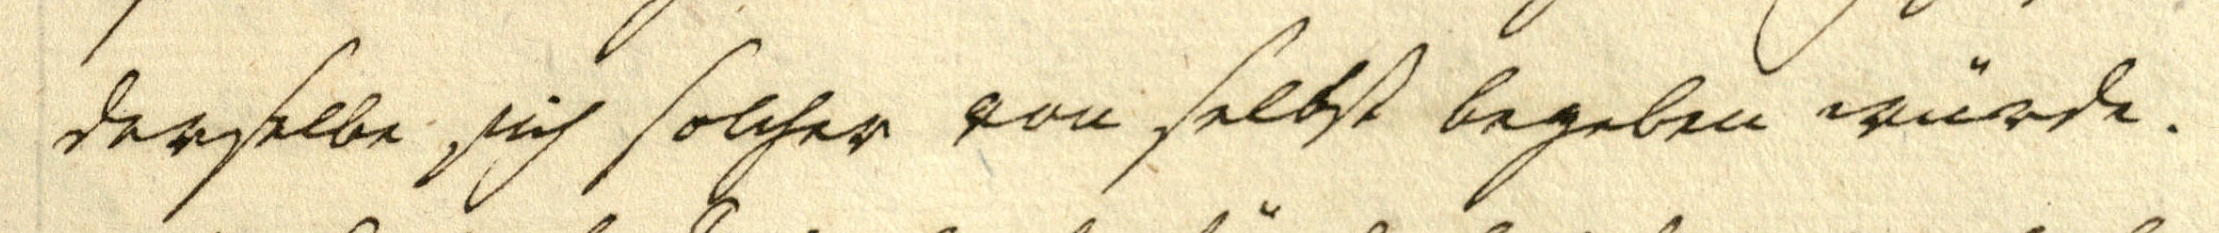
derselbe sich solcher von selbst begeben würde.
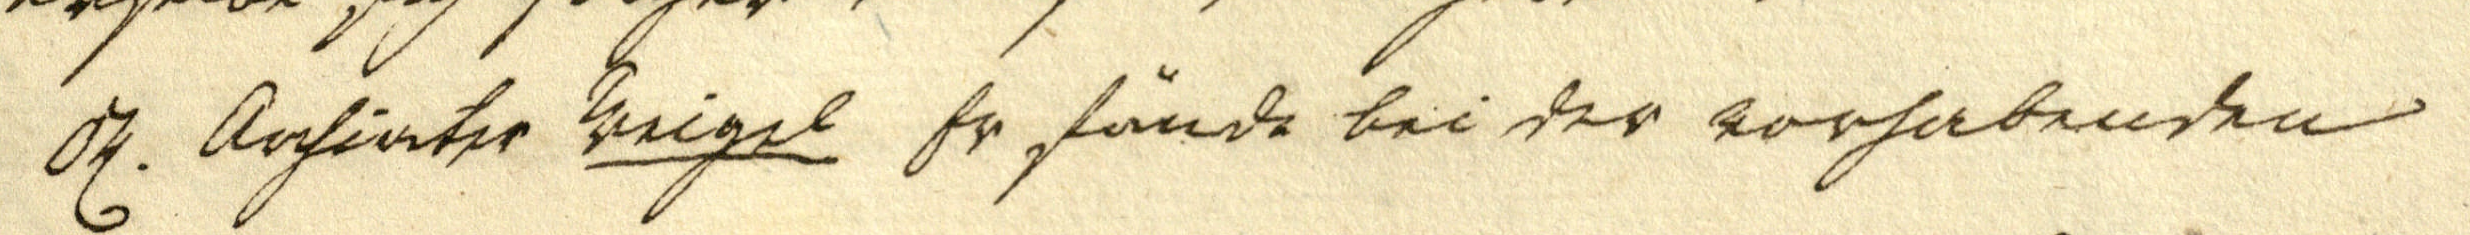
dh. Archiater Weigel Er fände bei der vorhabenden
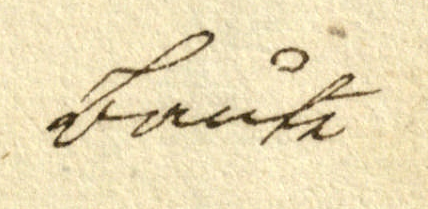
Baute
